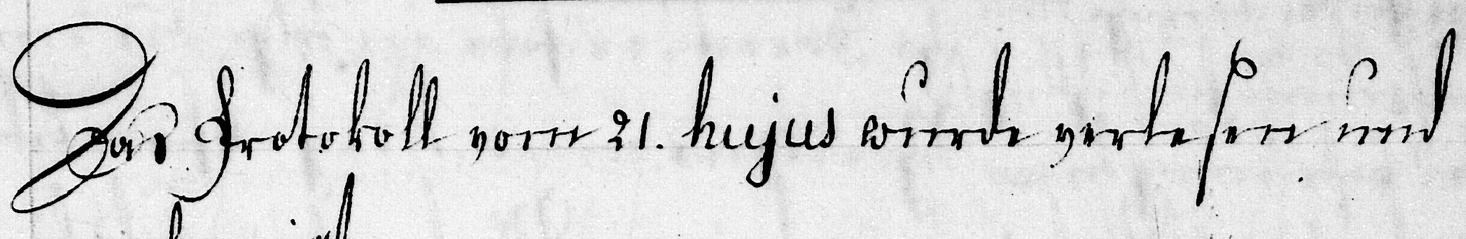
Das Protokoll vom 21. hujus wurde verlesen und
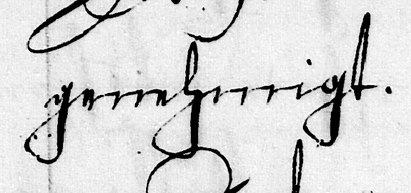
genehmigt.
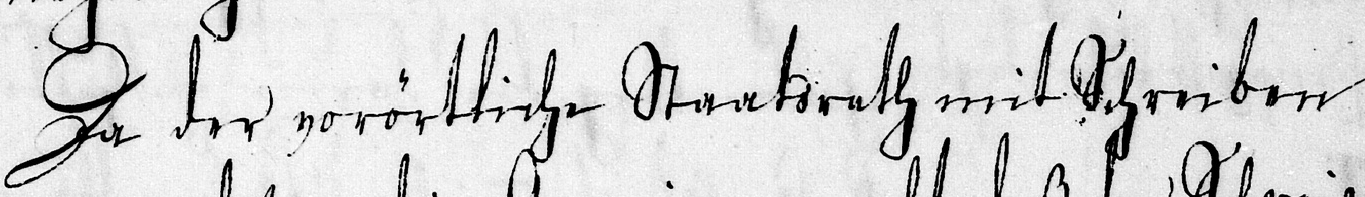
Da der vorörtliche Staatsrath mit Schreiben
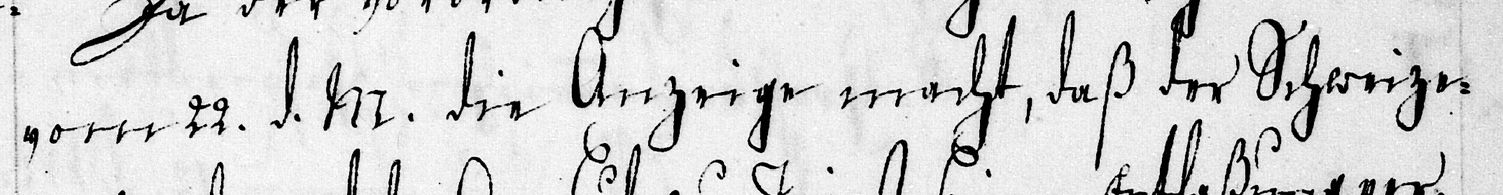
vom 22. d. M. die Anzeige macht, daß der Schweize¬
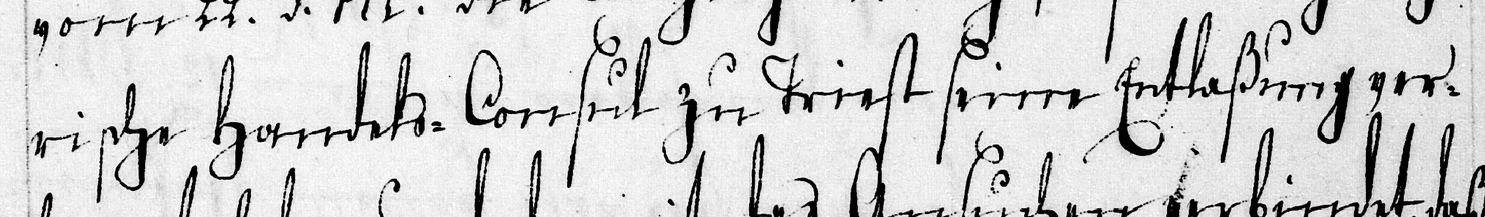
rische Handels-Consul zu Triest seine Entlaßung ver¬
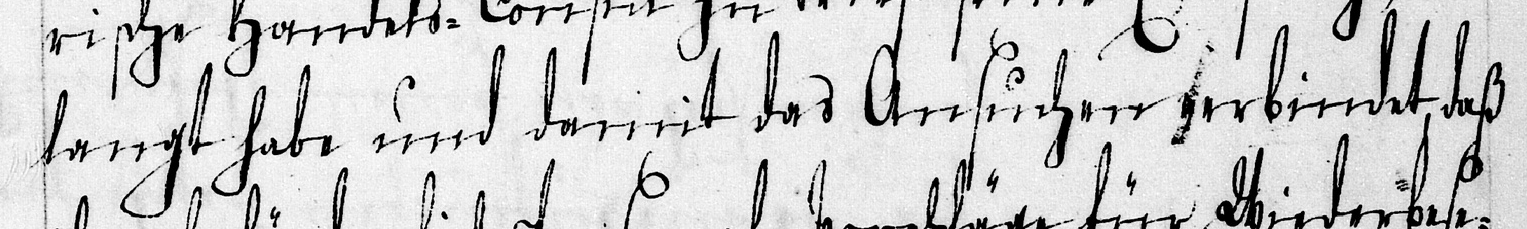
langt habe und damit das Ansuchen verbindet, daß
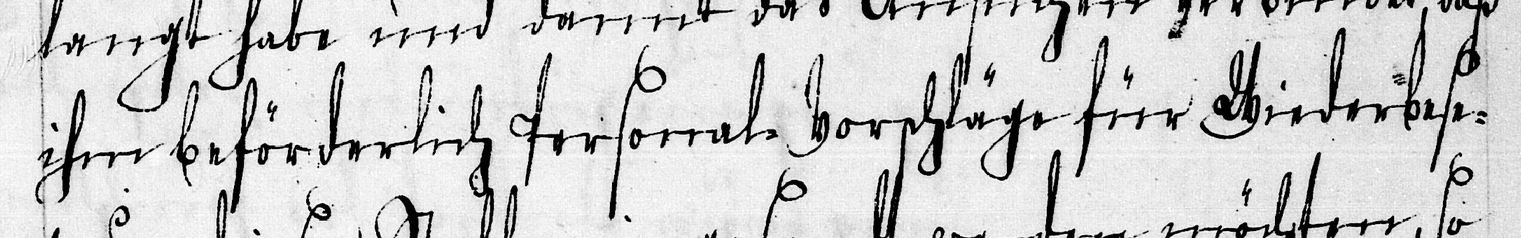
ihm beförderlich Personal-Vorschläge für Wiederbese¬
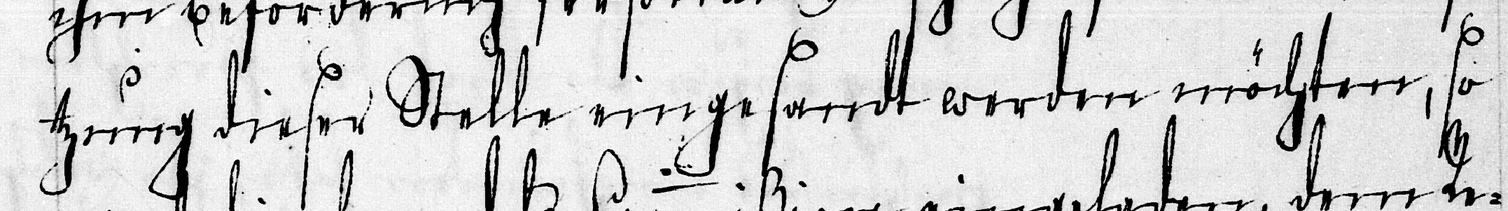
tzung dieser Stelle eingesandt werden möchten, so
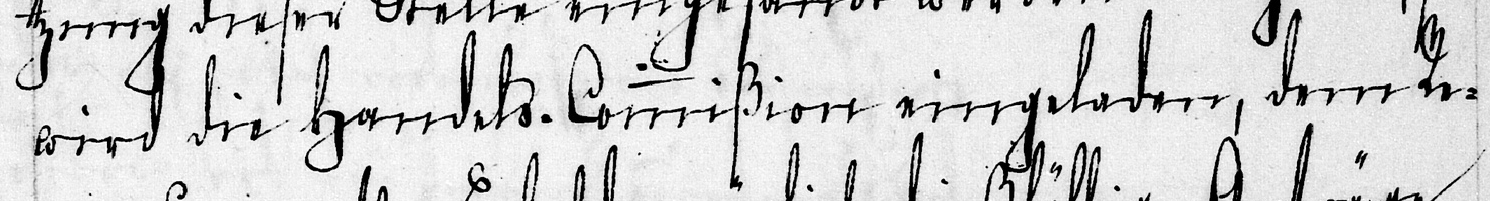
wird die Handels-Commißion eingeladen, dem Re¬
